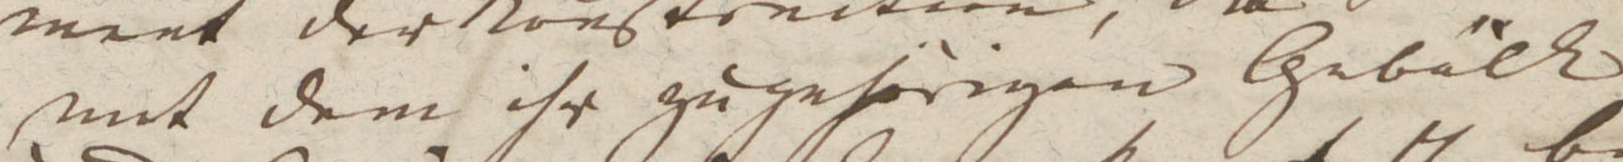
mit dem ihr zugehörigen Gebälk
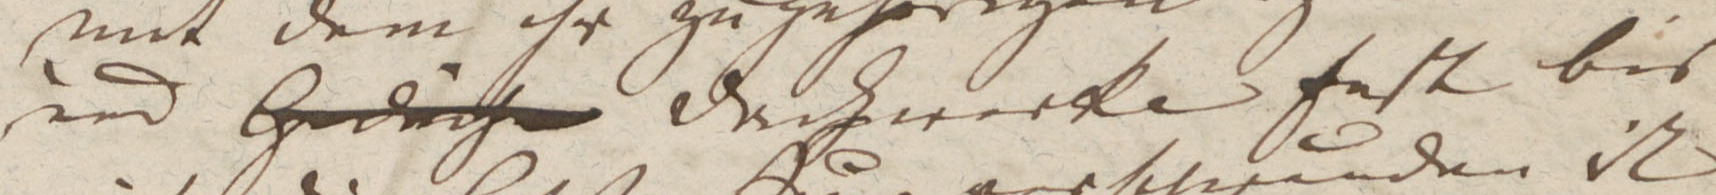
und Gedäche Dachwerke fast bis
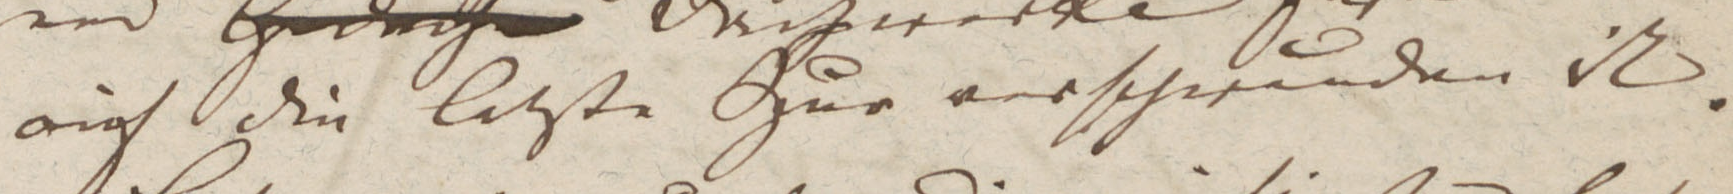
auf die letzte Spur verschwunden ist.
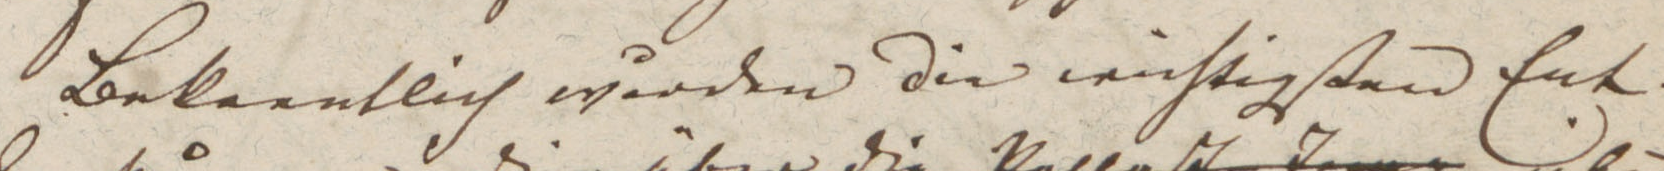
Bekanntlich wurden die wichtigsten Ent-
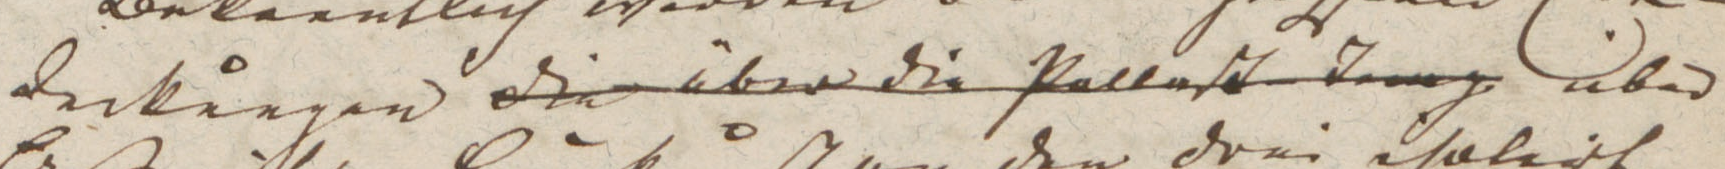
deckungen die über die Pallast-Temp über
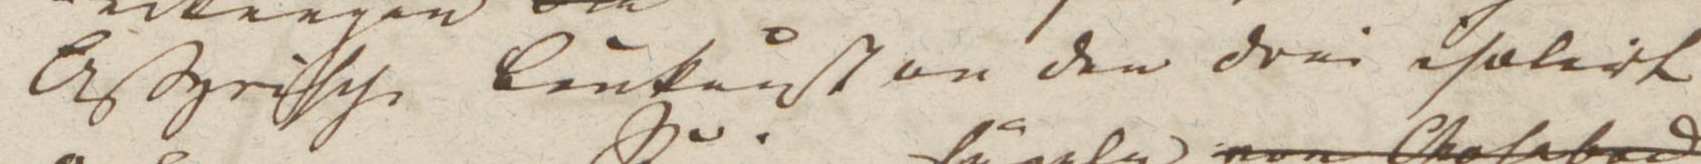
Assyrische Baukunst an den drei isolirt
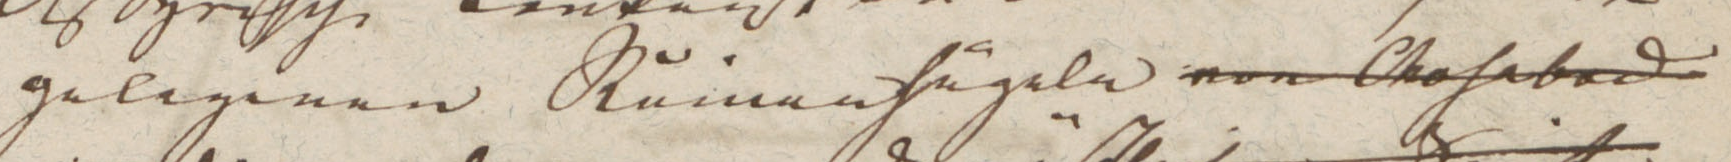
gelegenen Ruinenhügeln von Chosabad
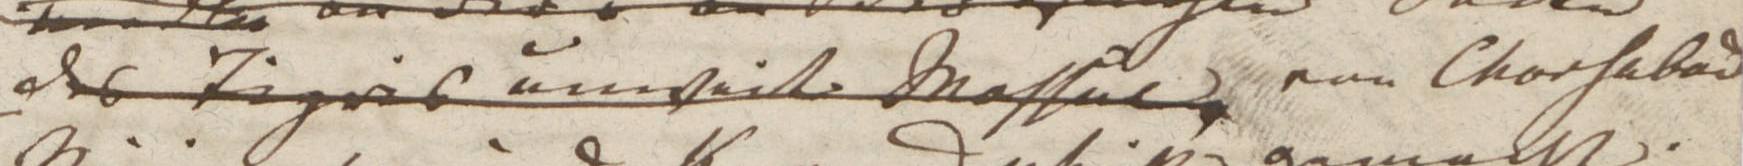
des Tigris unweit Mossul von Chorsabad
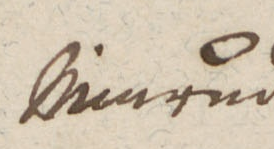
Nimrud
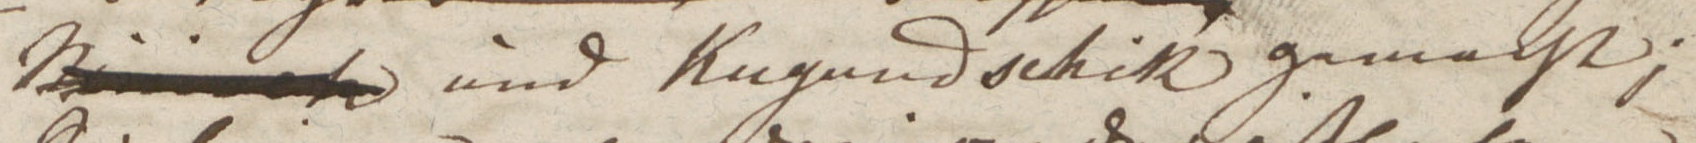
Niniveh und Kuundschik gemacht;
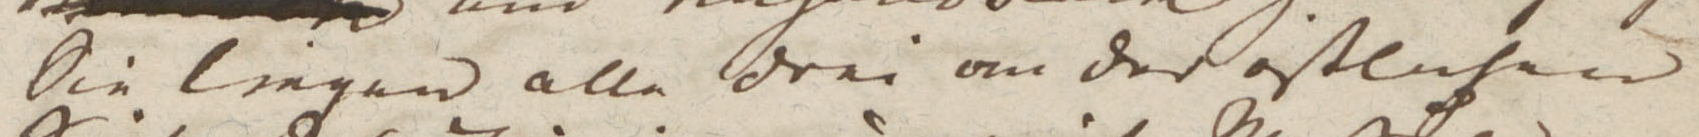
Sie liegen alle drei an der östlichen
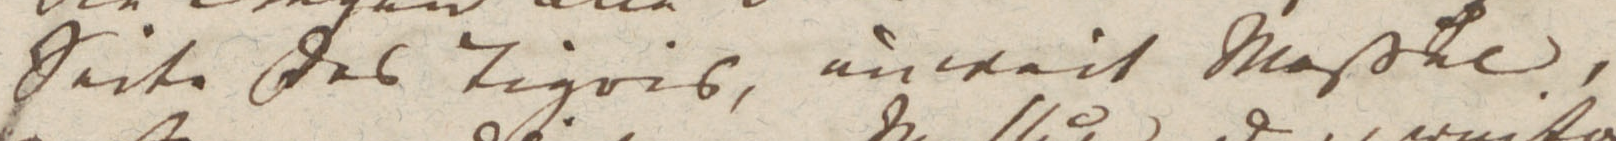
Seite des Tigris, unweit Mossul,
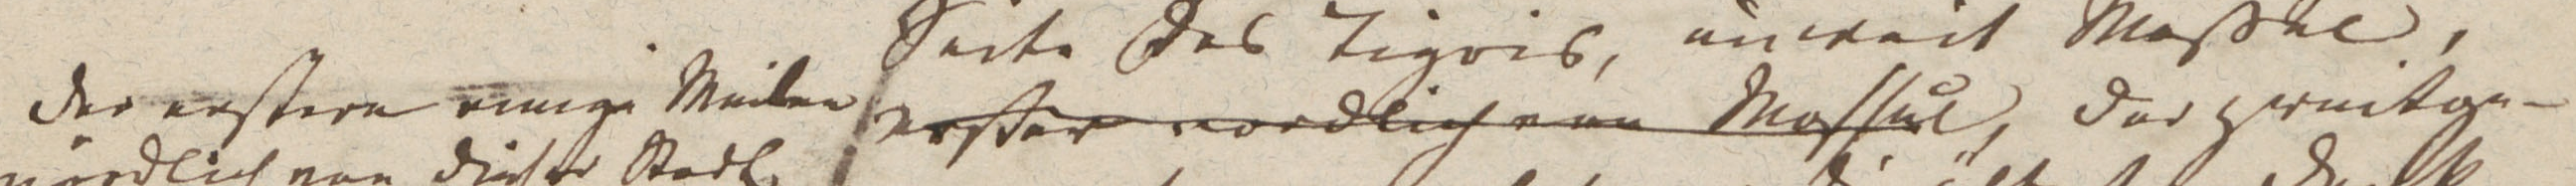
der erstere einige Meilen nördlich von dieser Stadt erster nordlich von Mossul, der zweitge-
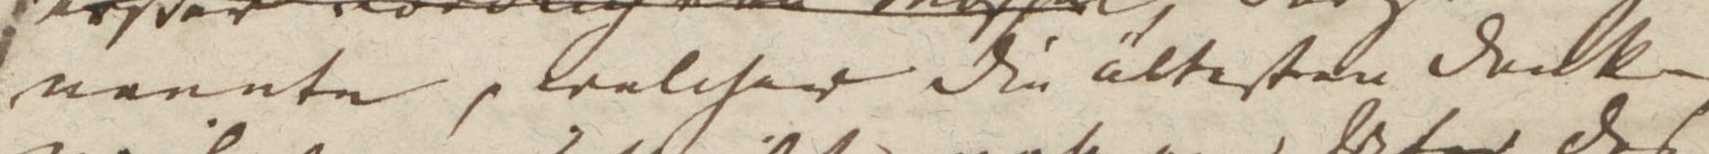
nannte, welcher die ältesten Denk-
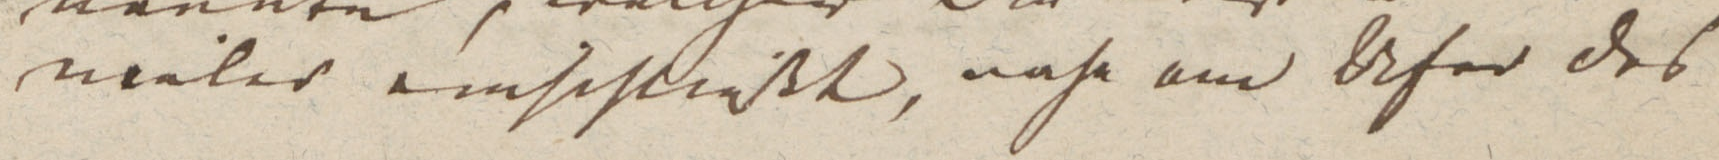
mäler einschliesst, nahe am Ufer des
